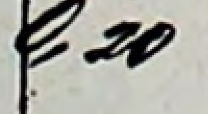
0,20
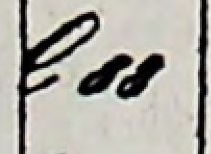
0,88
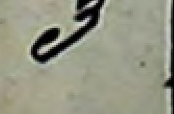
3
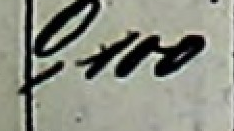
0,100
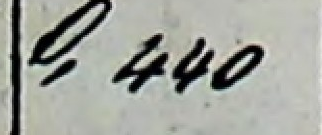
0,440
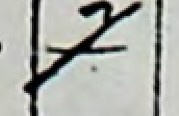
7
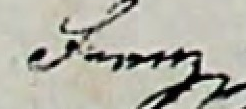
Franz
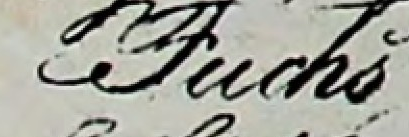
Fuchs
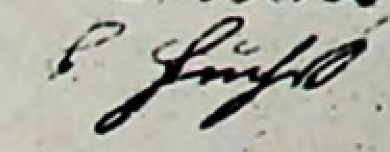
v. Fuchs
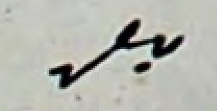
do
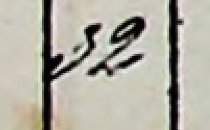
32
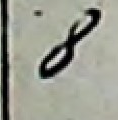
8
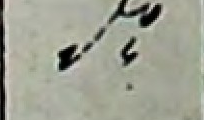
do
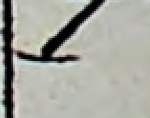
I
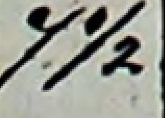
7 1/2
